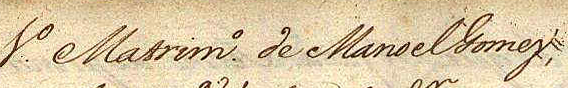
1.o Matrim.o de Manoel Gomez,
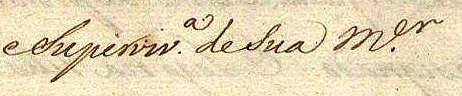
e Supirviv.a de Sua m.er
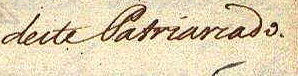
deste Patriarcado.
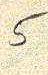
5
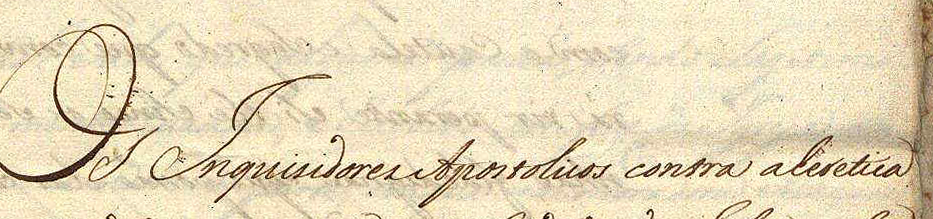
Os Inquisidores Apostolicos contra a heretica
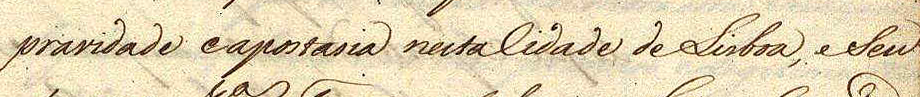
pravidade e apostasia nesta Cidade de Lisboa, e Seu
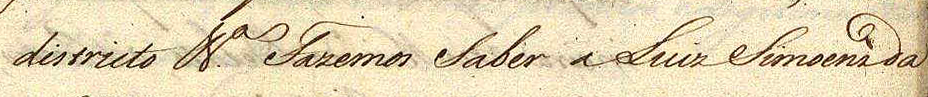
districto &.a Fazemos Saber a Luiz Simoens da
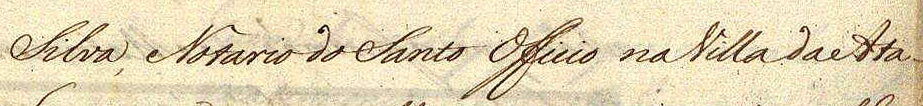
Silva, Notario do Santo Officio na Villa da Ata
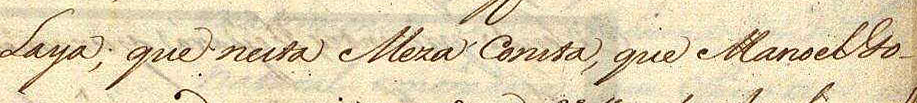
Laya; que nesta Meza consta, que Manoel Go
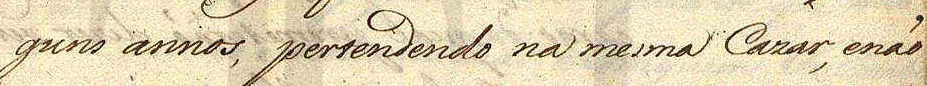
guns annos, pertendendo na mesma Cazar, e naõ
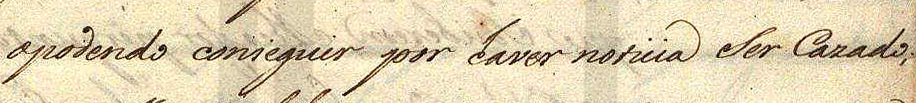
o podendo conseguir por haver noticia Ser Cazado,
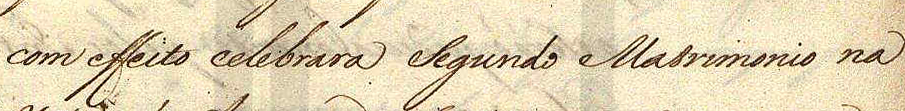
com effeito celebrara Segundo Matrimonio na
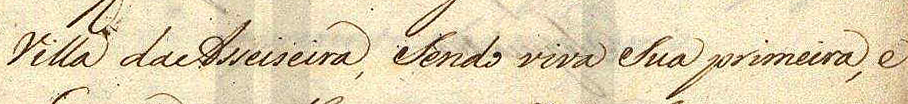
Villa da Asseiseira, Sendo viva sua primeira, e
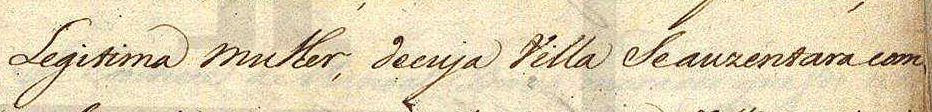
Legitima mulher, de cuja Villa Se auzentara com
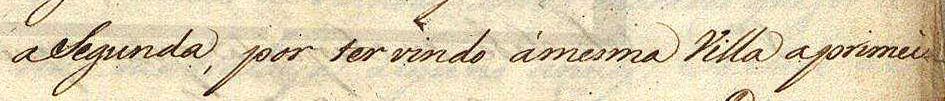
a Segunda, por ser vindo á mesma Villa a primei
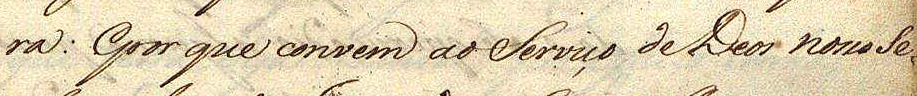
ra: E porque convem ao Serviço de Deos nosso Se
